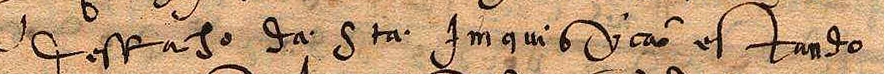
despacho da Sta Jmquisyçaõ estando
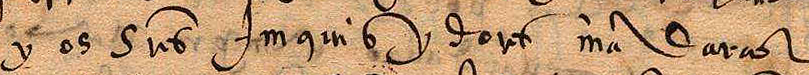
hy os sr̄es Jmquisydores mādaraõ
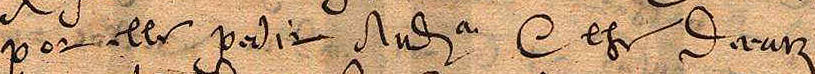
por elle pedir Audja E lhe deram
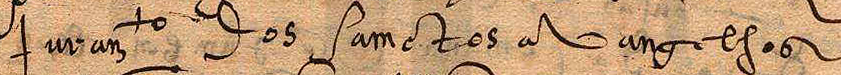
Juramto dos Samctos avangelhos
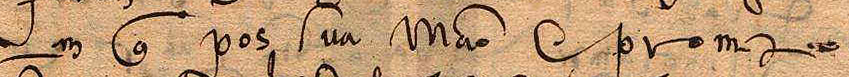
em q̄ pos sua Mão e prometeo
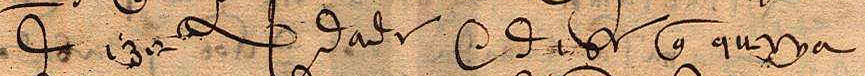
dizer ꝟdade e dise q̄ querya
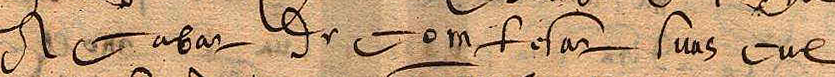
ACabar de Comfesar suas cul
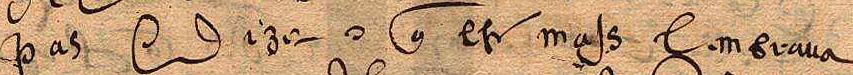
pas e dizer o q̄ lhe majs lembraua
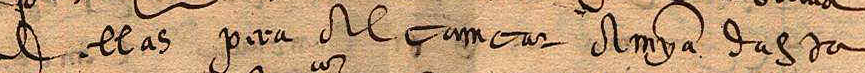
dellas pera Alcamçar A mȳa da sta
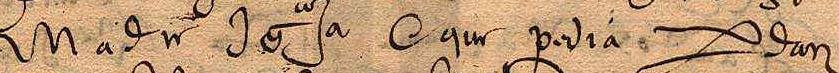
Madre JḡJa e que pedia ꝑdam
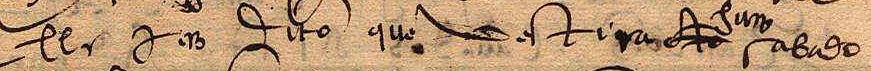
elle tem dit̄o que vestira Aa hum sabado
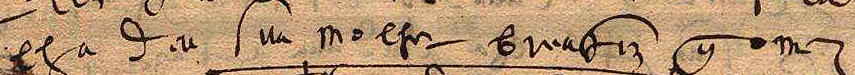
lha deu sua molher breat̄iz gomez
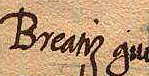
Breatiz guo
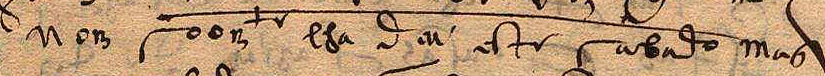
e nom soomte lha deu este sabado mas
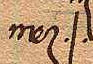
mez ./.
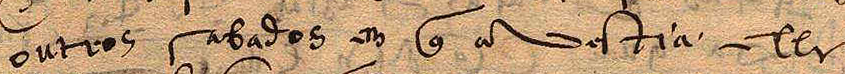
outros sabados em q̄ a vestia elle
